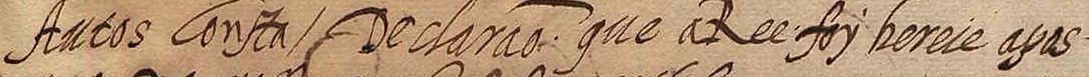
Autos consta/ Declarão que a Ree foy hereie apos
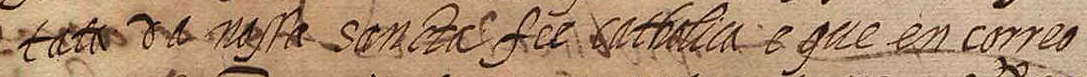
tata da nossa sancta fee catholica e que encorreo
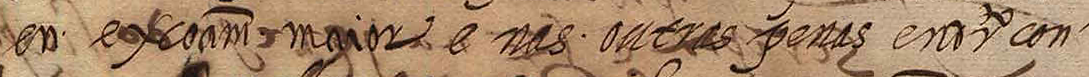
en excoām maior e nas outras penas en drto con
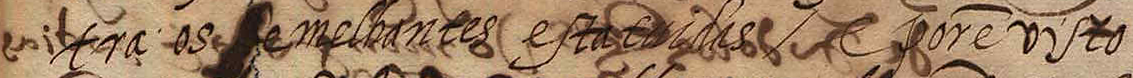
tra os semelhantes estatuidas / e porē visto
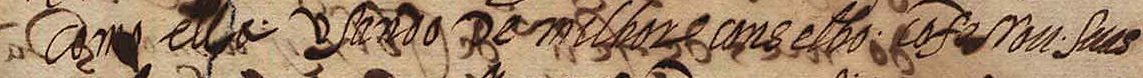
como ella vsando De milhor conselho cōfessou suas
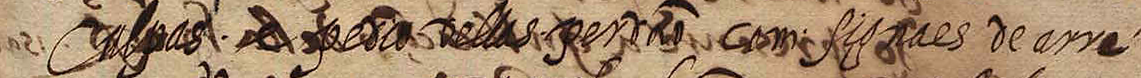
Culpas e pedio dellas perdão com signaes de arre
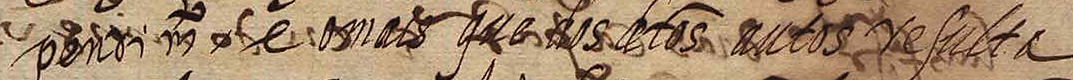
pendimto e o mais que dos dtos autos resulta
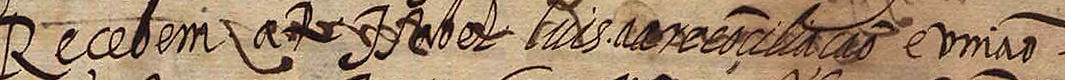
Recebem a Re Jsabel luis aa recōciliaçaõ e vnião
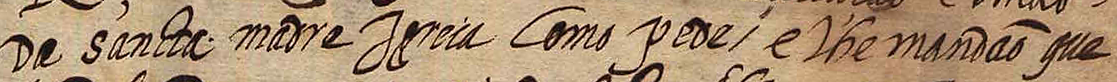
Da sancta madre Jgreia Como pede / e lhe mandão que
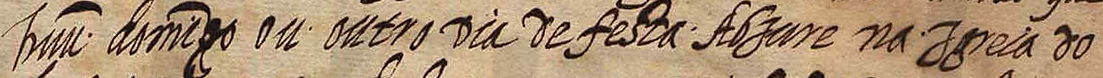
hūu domīgo ou outro dia de festa Abjure na Igreia do
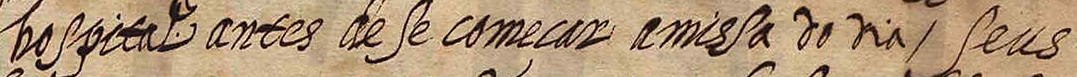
hospitaL antes de se começar a missa do dia / seus
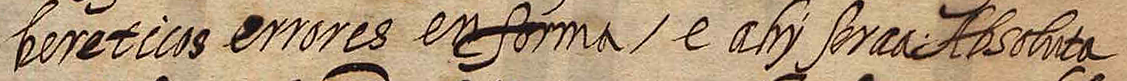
hereticos errores en forma / e ahy seraa Absoluta
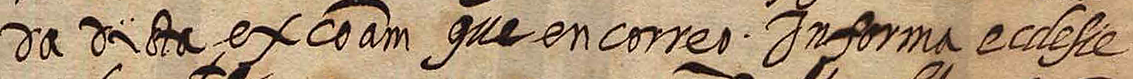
da dicta excōam que encorreo Jn forma ecclesie
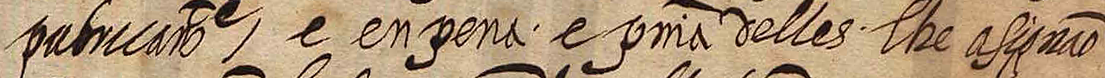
pubricamte / e en pena e pn̄ia delles lhe asign̄ao
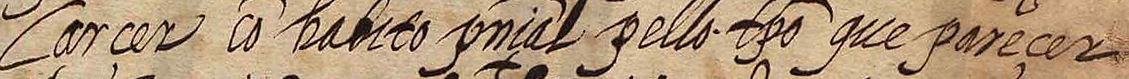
Carcer cō habito pn̄iaL pello tp̄o que parecer
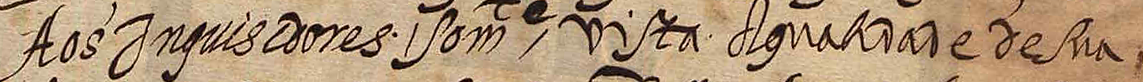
Aos Jnquisidores / somte / vista A qualidade de sua
